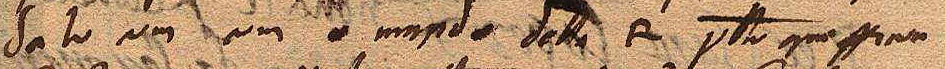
dalo com com o marido della R p̄llo que fficou
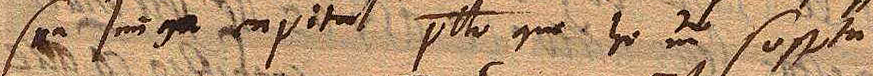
sua Jmiga capital p̄llo que he mto sospta
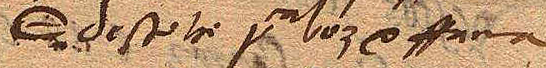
E desto he pca voz e ffama
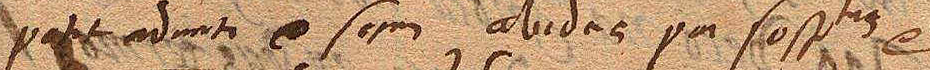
petit admiti e serem avidas por sosptas e
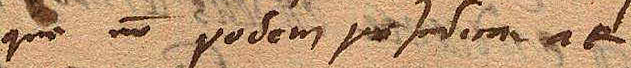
que nō podem preJudicar a R
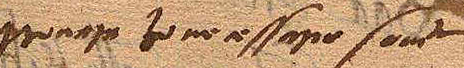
prouara ho necessario somte
